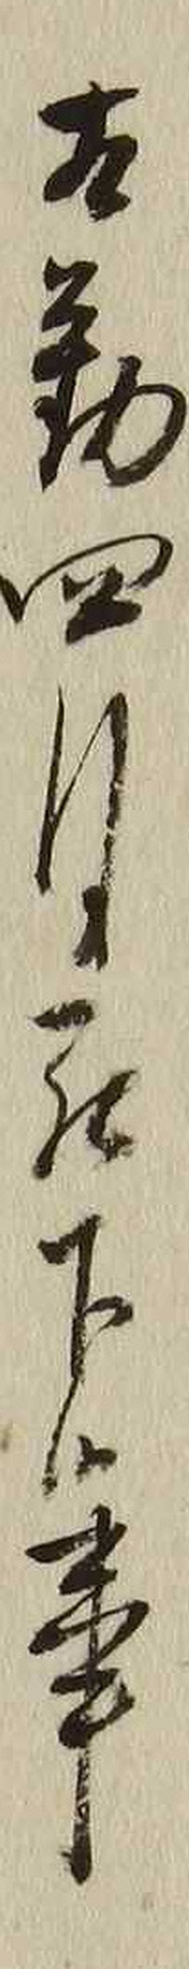相勤四月罷下候事
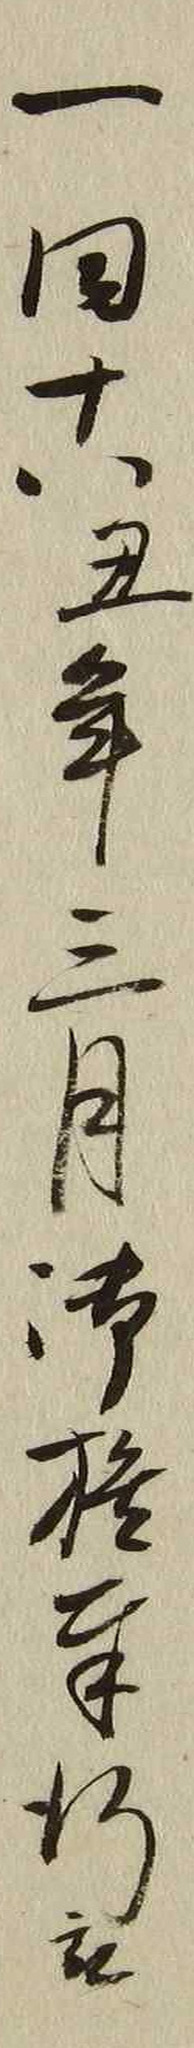一同十八丑年三月御旗奉行被
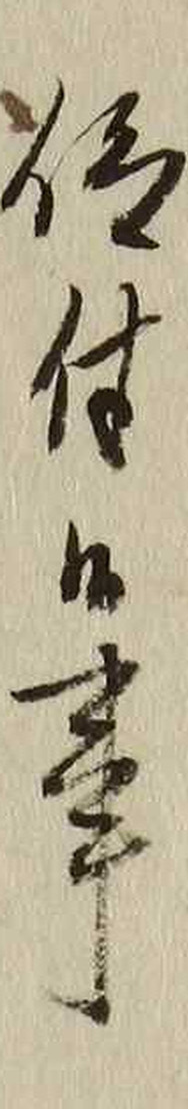仰付候事
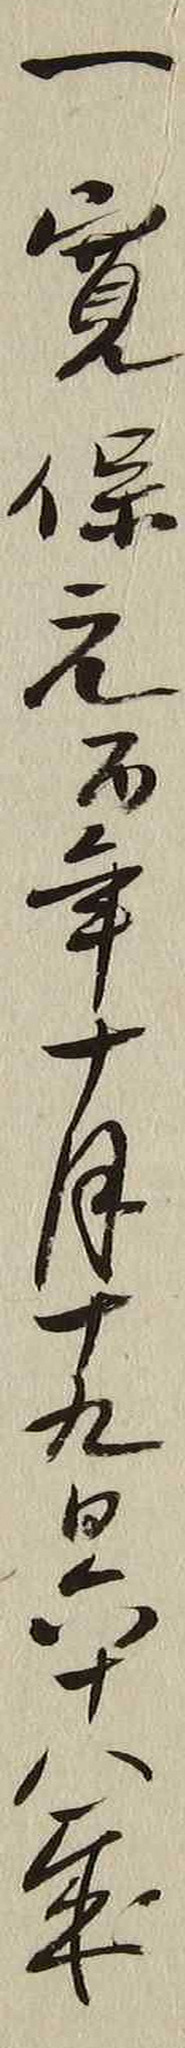一寛保元酉年十月十九日六十八歳
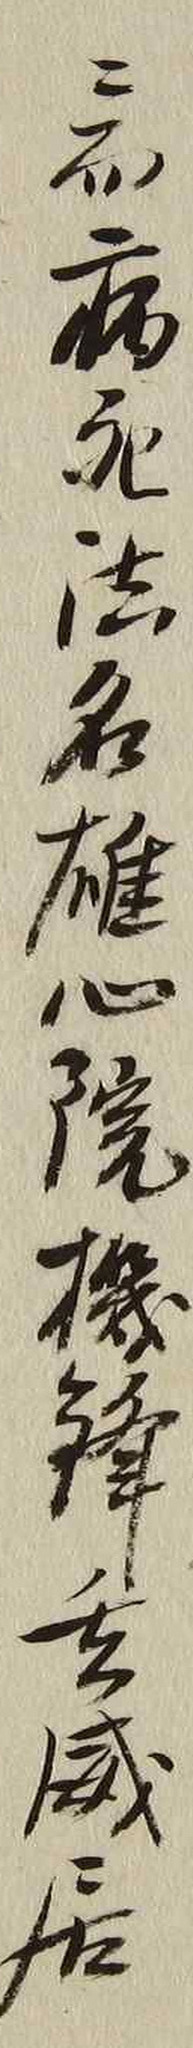ニ而病死法名雄心院機鉾玄威居
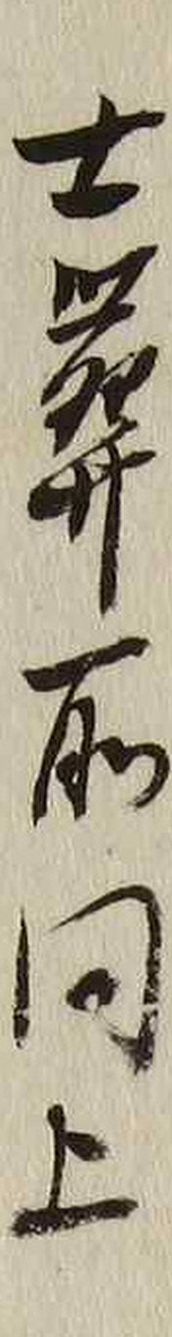士葬所同上
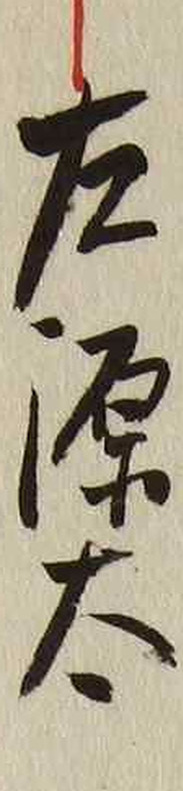左源太
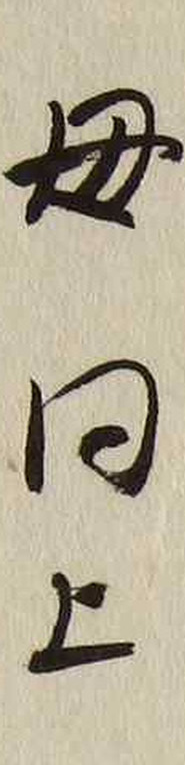母同上

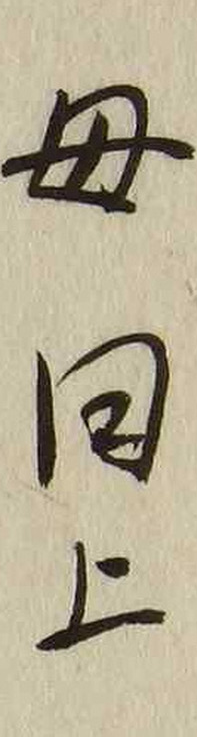母同上
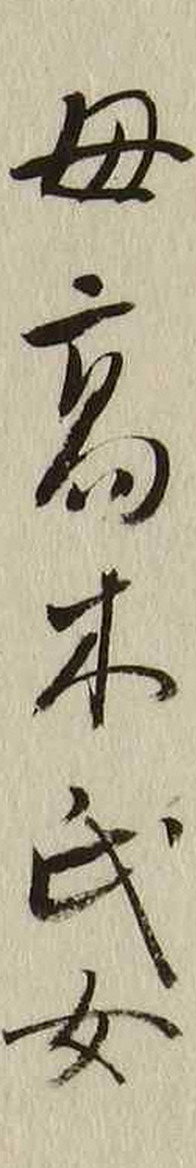母高木氏女
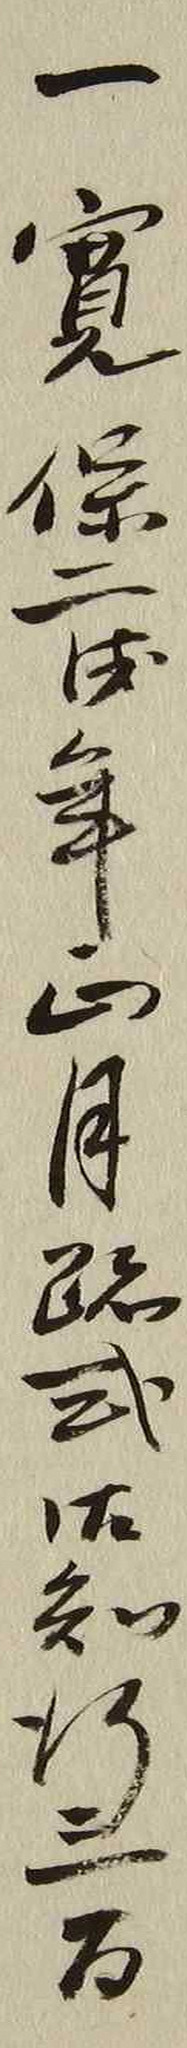一寛保二戌年正月跡式御知行三百
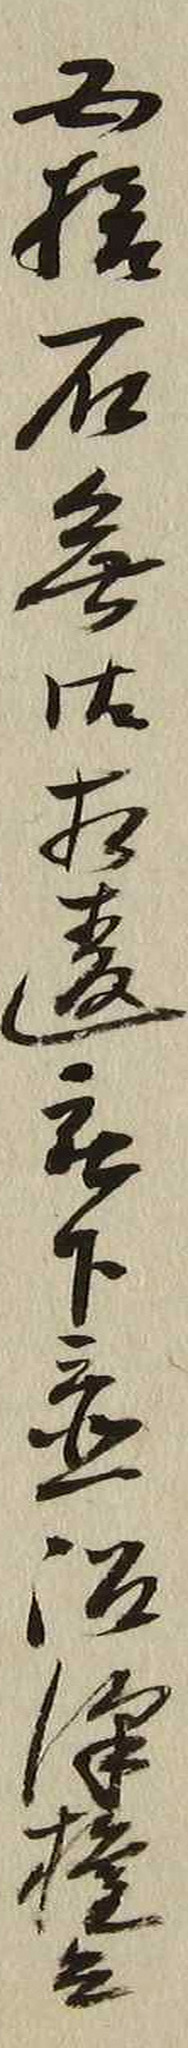五拾石無御相違被下置沼沢権兵
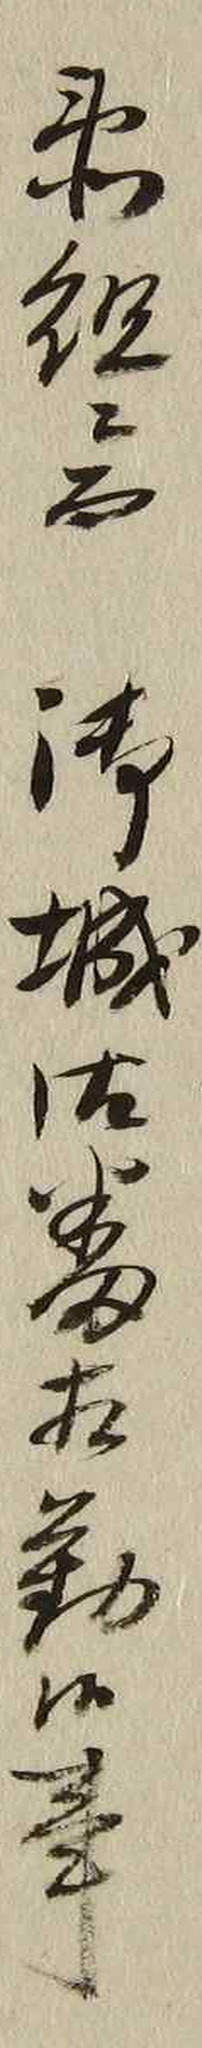衛組ニ而御城御番相勤候事
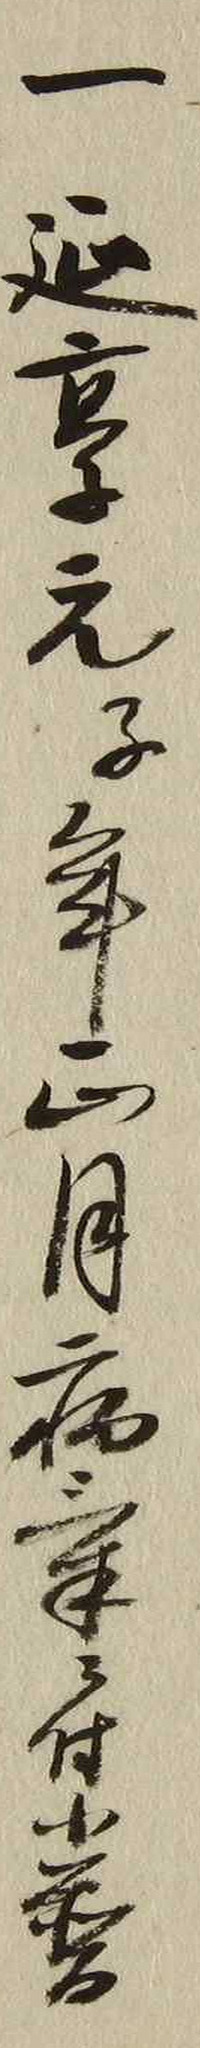一延享元子年正月病気ニ付小普
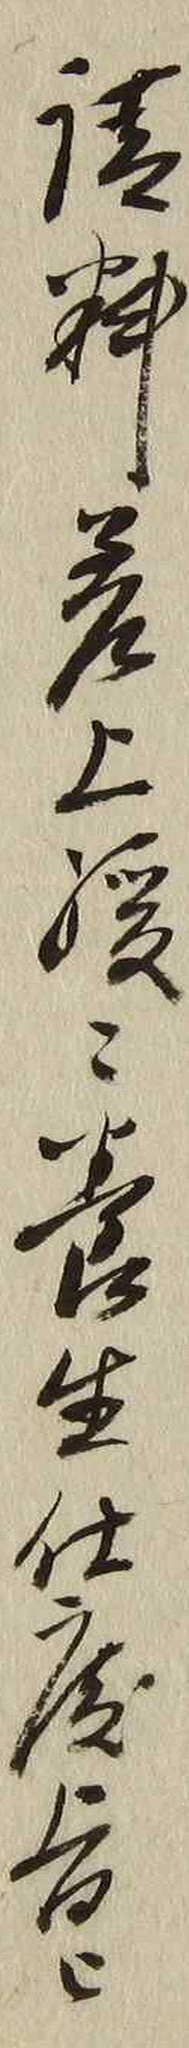請料差上緩々養生仕度旨被
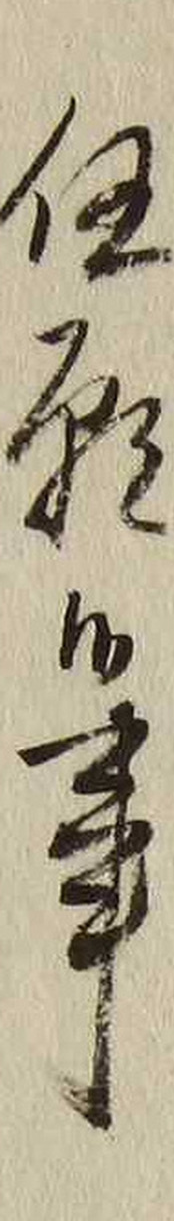任願候事
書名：諸士系譜　巻之355　す之部5
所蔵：会津若松市立会津図書館
